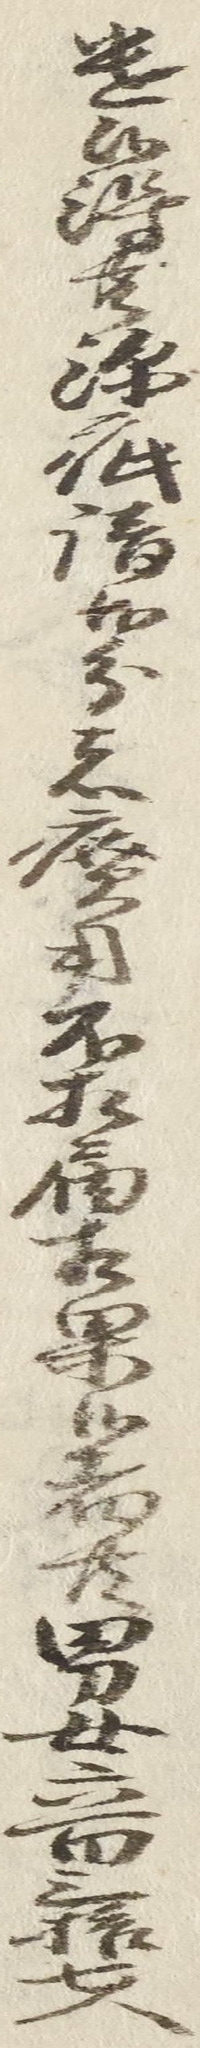遣候得共深疵請候分は療用不相届果候者共男女六百三拾七人
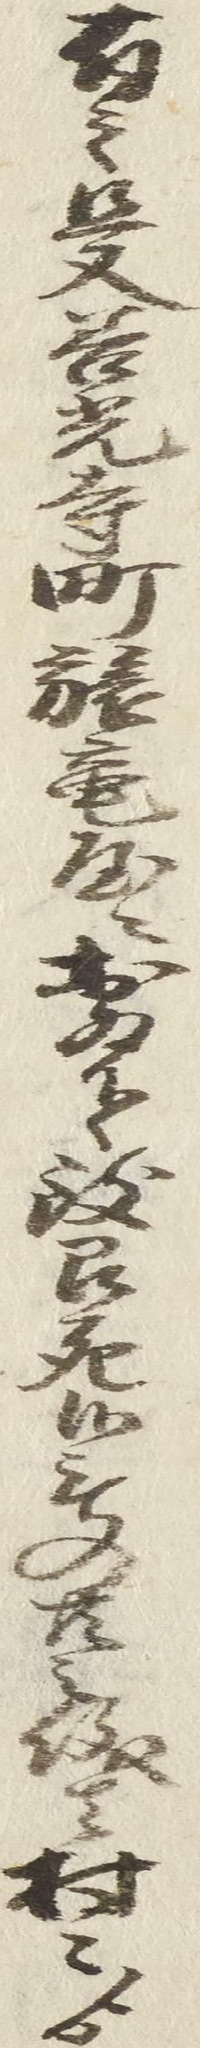有之且又善光寺町旅籠屋ニおゐて致即死候もの共之儀は村々ゟ
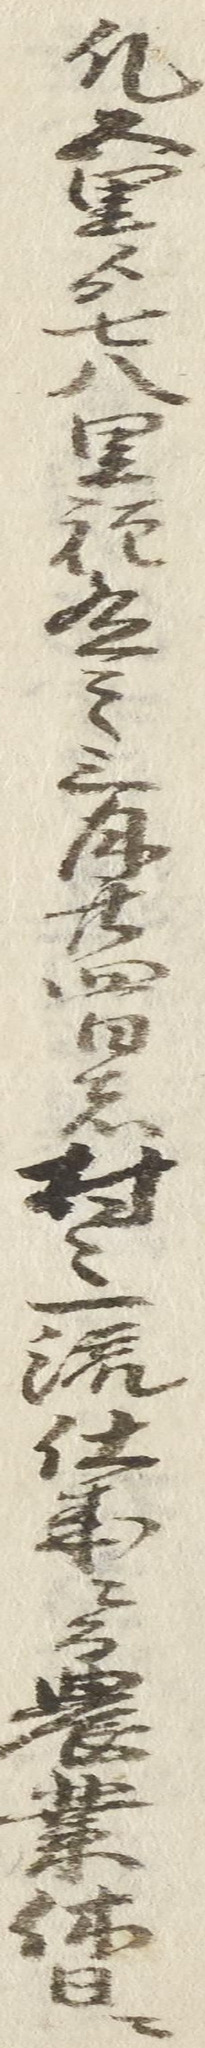凡五里ゟ七八里程有之三月廿四日は村々一統仕来ニ而農業休日ニ
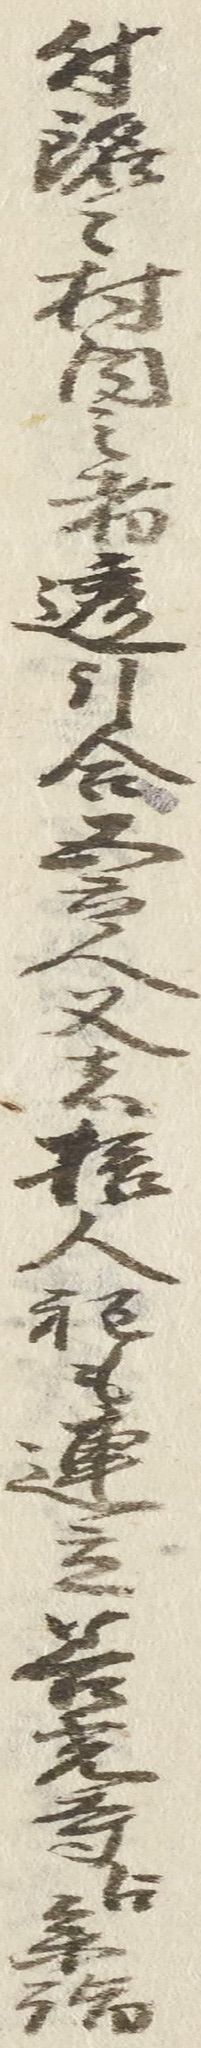付銘々村内之者透引合五六人又は拾人程も連立善光寺江参詣
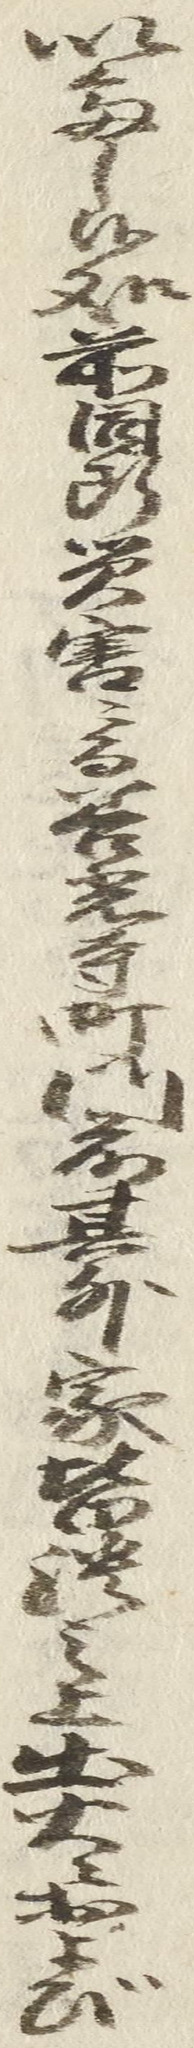いたし候処前同断災害ニ而善光寺町門前其外家皆潰之上出火ニおよび
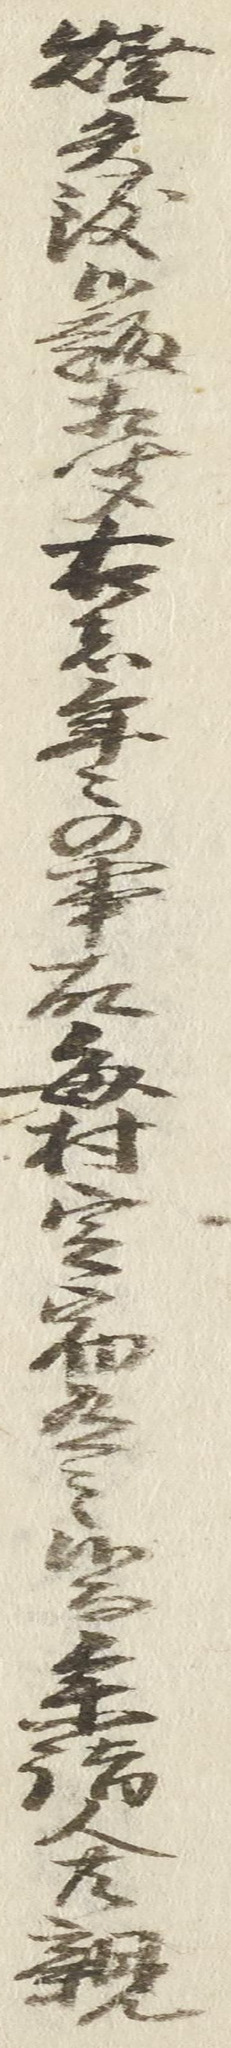焼失致候趣相聞右は年々の事故毎村定宿有之候而参詣人共親
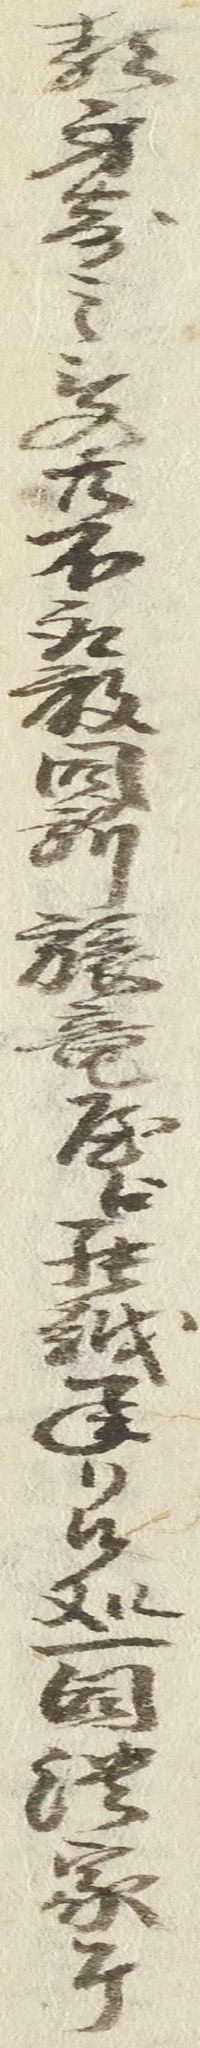類身寄之もの共不取敢同所旅籠屋江罷越承り候処一同潰家に
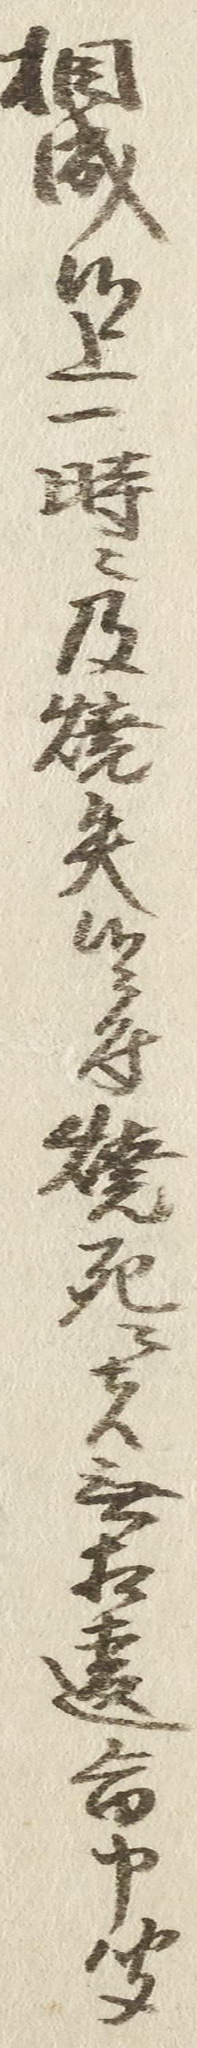相成候上一時ニ及焼失候ニ付焼死ニは無相違旨申聞
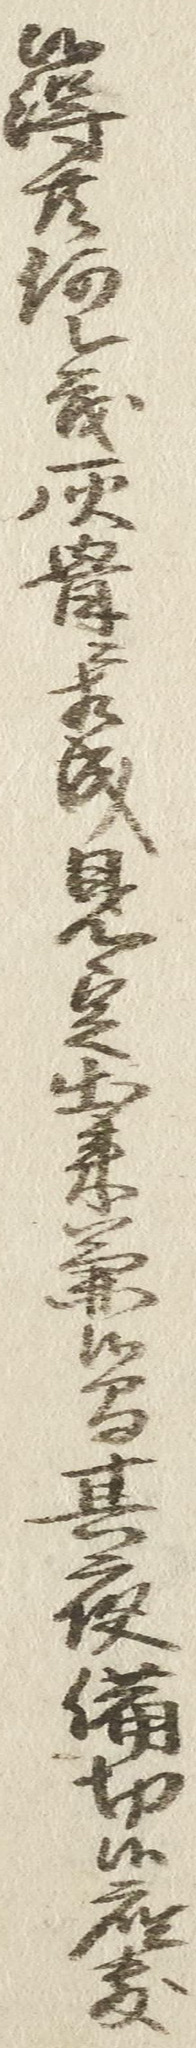候得共何レも灰骨ニ相成見定出来兼候間其夜備切候座敷
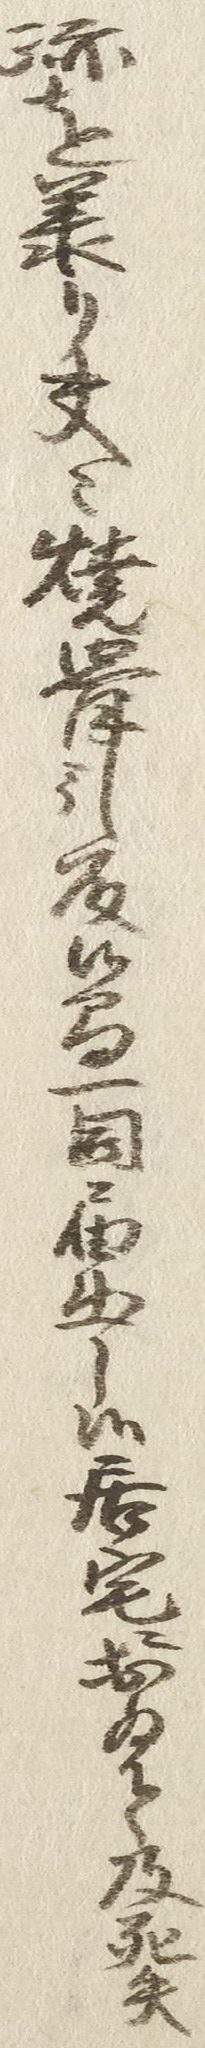跡を承り夫々焼骨引取候間一同届出し候居宅ニおゐて及死失
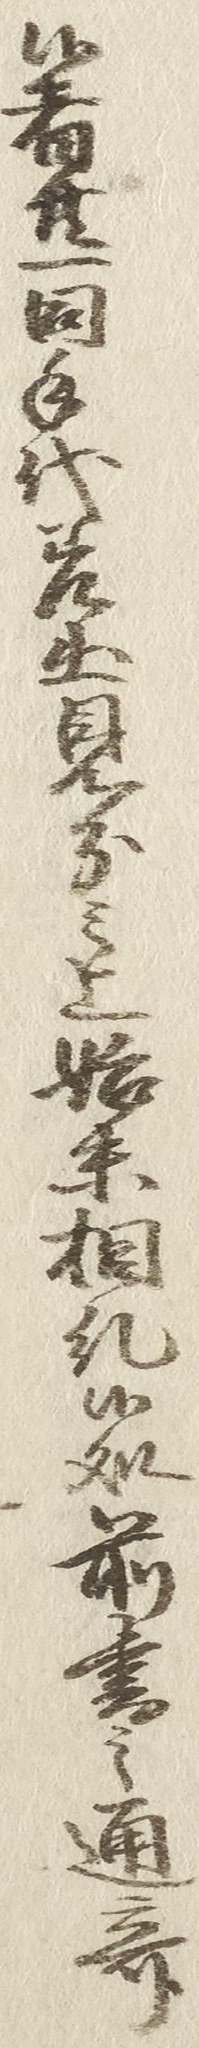候者共一同手代差出見分之上始末相糺候処前書之通奇
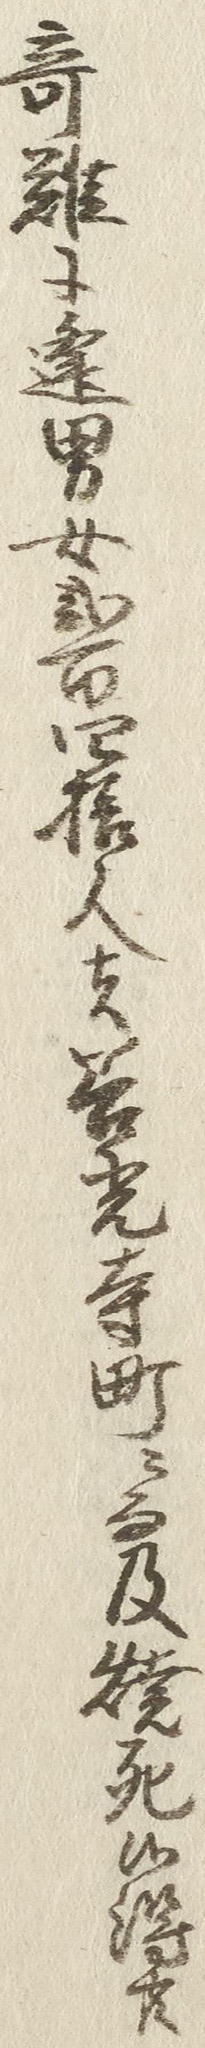奇難に逢男女弐百四拾人は善光寺町ニ而及焼死候得共
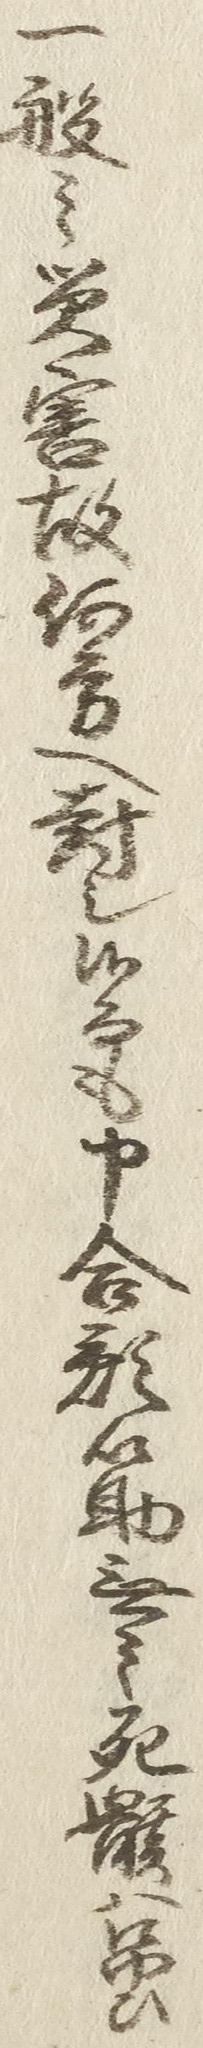一般之災害故何方へ対シ候而も申合顔筋無之死骸は弔ひ
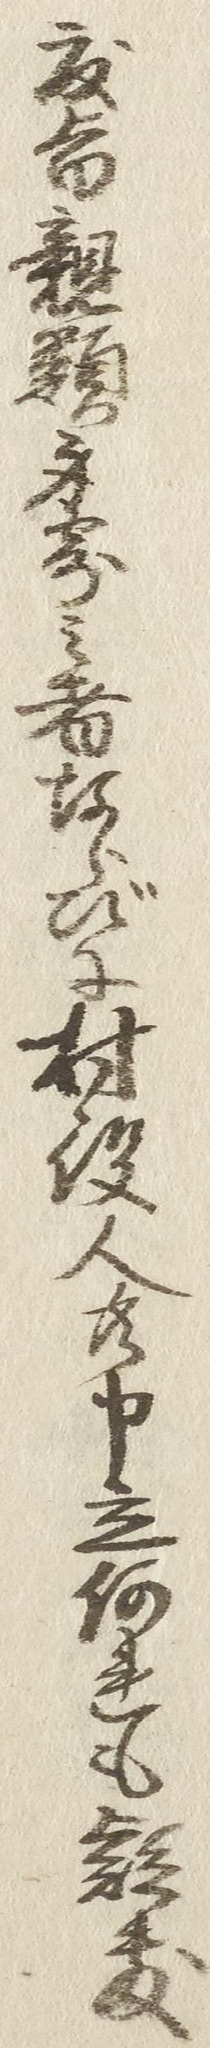度旨親類身寄之者ならびに村役人共申立何れも疑敷
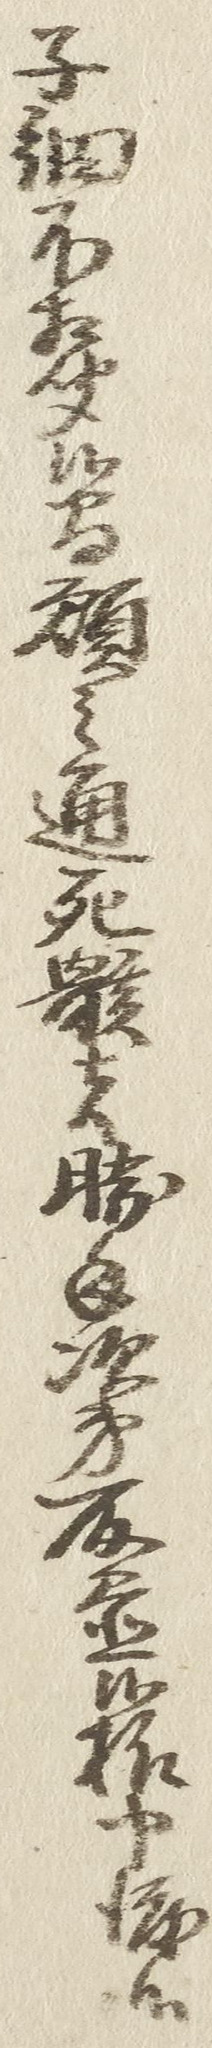子細不相聞候間願之通死骸は勝手次第取置候様申渡候
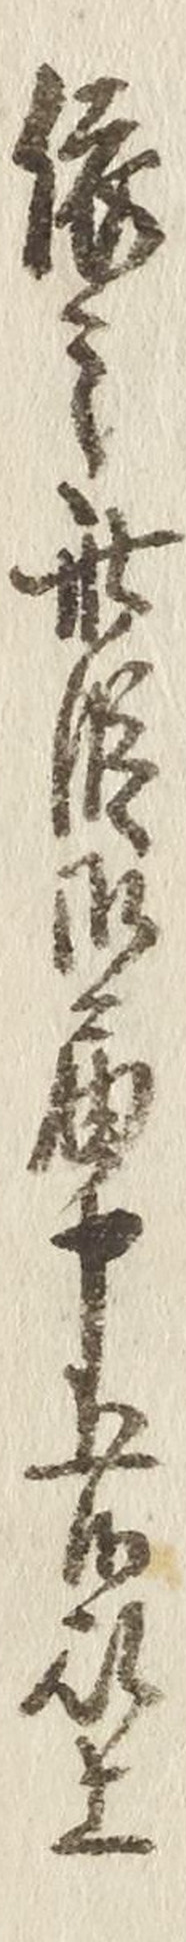依之此段御届申上候以上
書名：従往古地震御届書記誌之一
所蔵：東京大学地震研究所図書室 Earthquake Research Institute Library, The University of Tokyo, JAPAN
